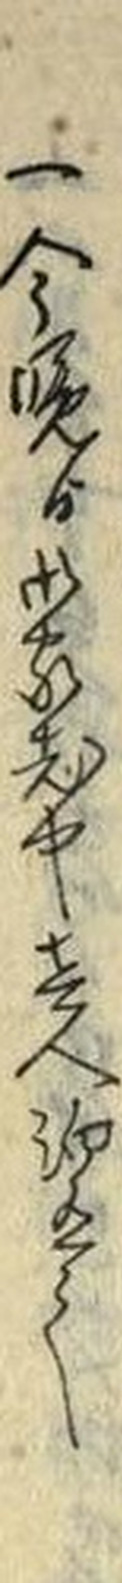一今晩ゟ御家老中壱人泊有之

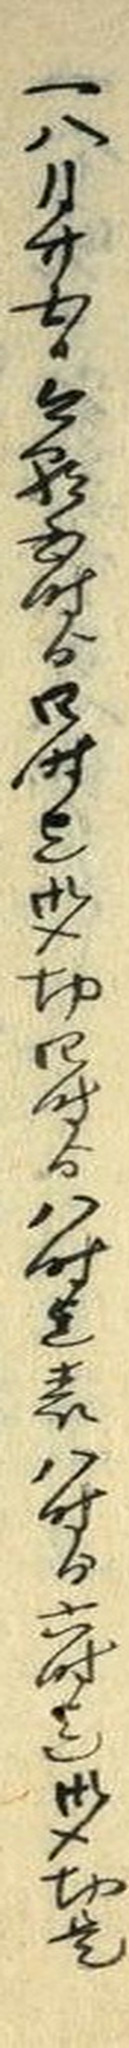一八月廿五日今朝五時ゟ四時迄御〆切四時ゟ八時迄表八時ゟ六時迄御〆切是
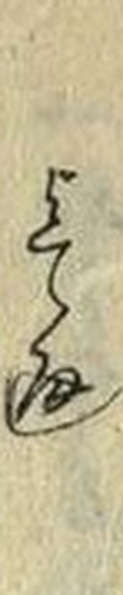迄之通
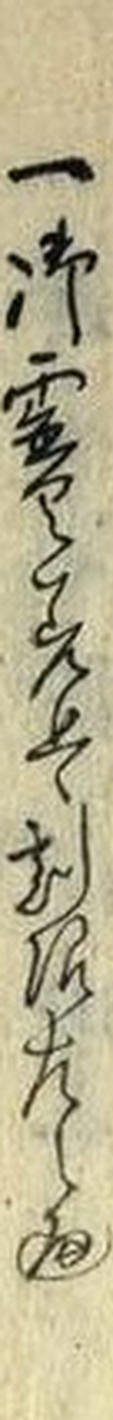一御霊具差上候刻限左之通
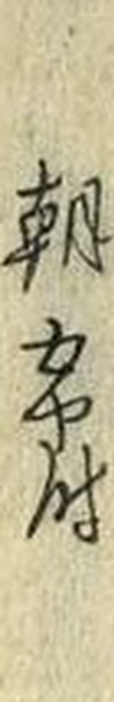朝五半時
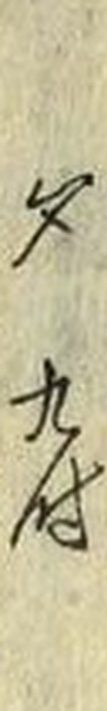夕九時
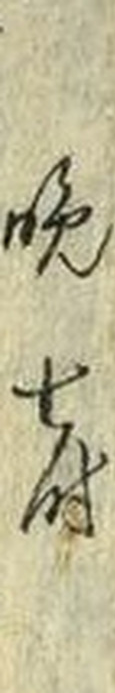晩七時
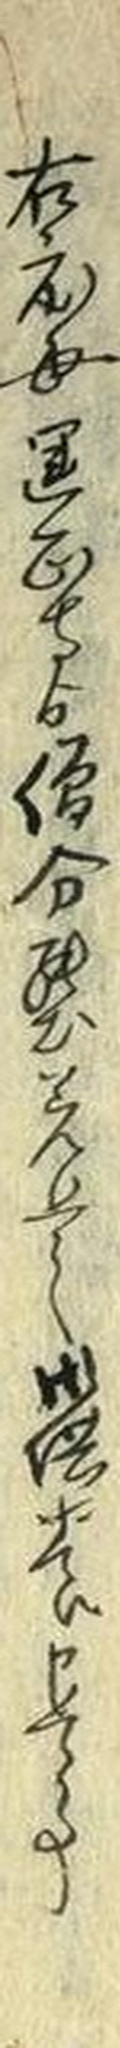右度毎運正寺ゟ僧分罷出差上之御供養申上候事
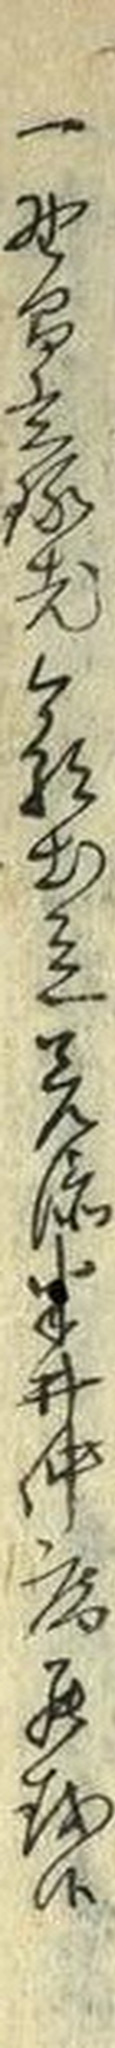一野間玄琢老今朝出立差添半井仲庵罷越候
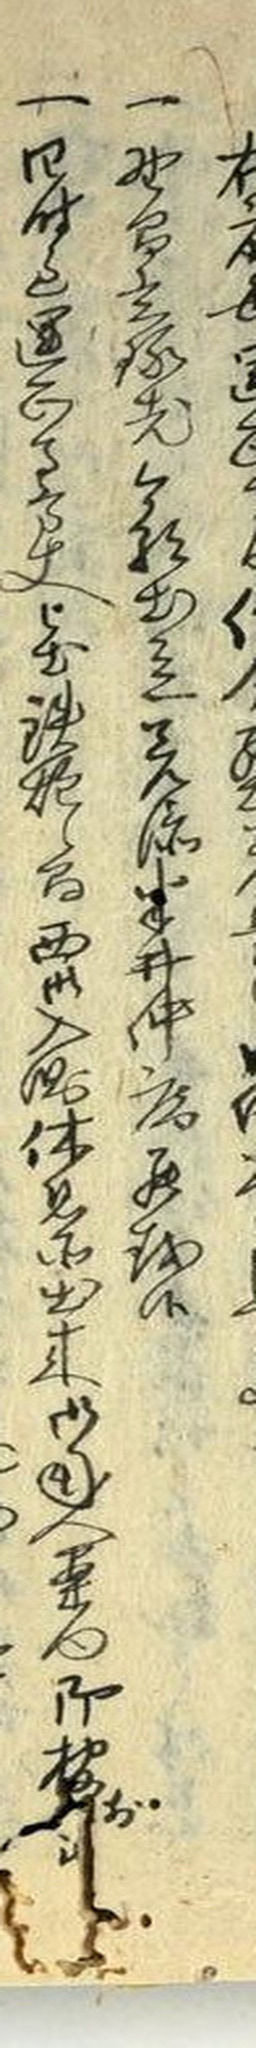一四時過運正寺方丈被出鉄炮之間西御入側休息所出来御用人案内御棺前被
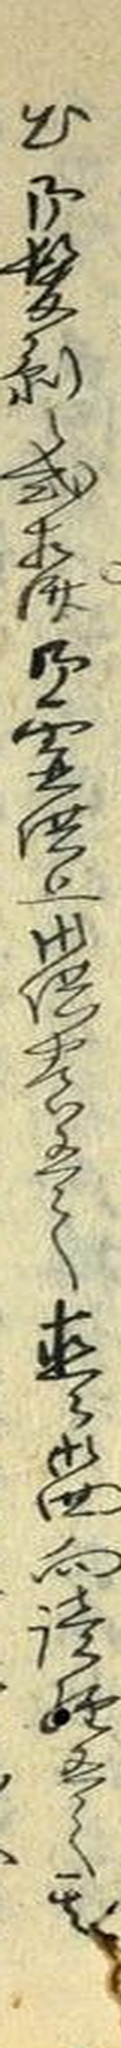出御髪剃之式相済御霊供上御供養有之直々御回向読経有之其
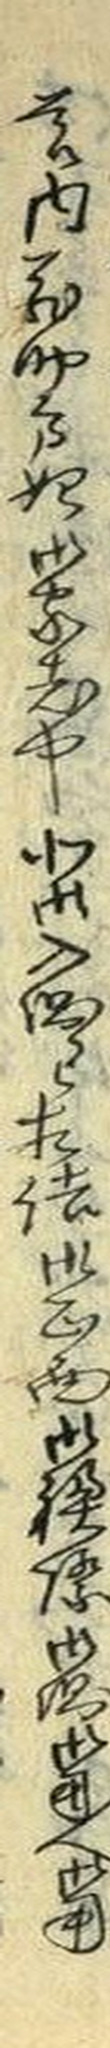節内蔵助方始御家老中北御入側へ被相詰御正面御襖際御側御用人御用
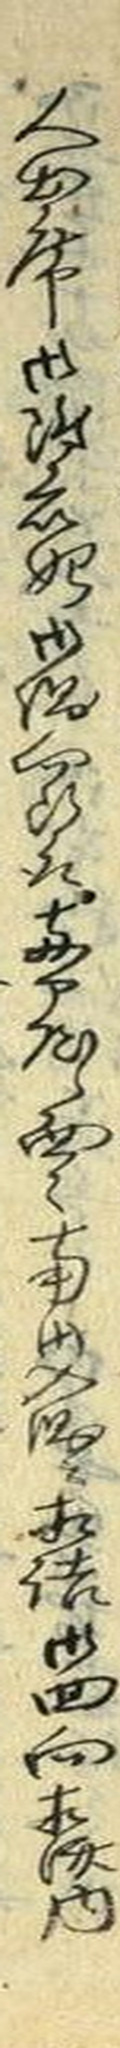人出席御附衆始御側向頭取両部屋之面々南入側ニ相詰御回向相済内
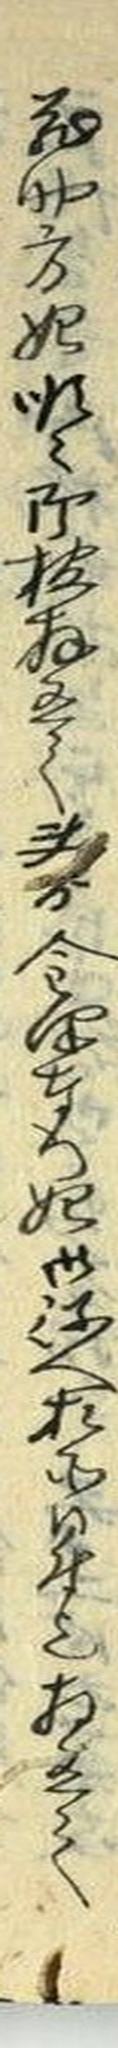蔵助方始順々御棺拝有之夫ゟ金津奉行始御役人札所目付迄拝有之
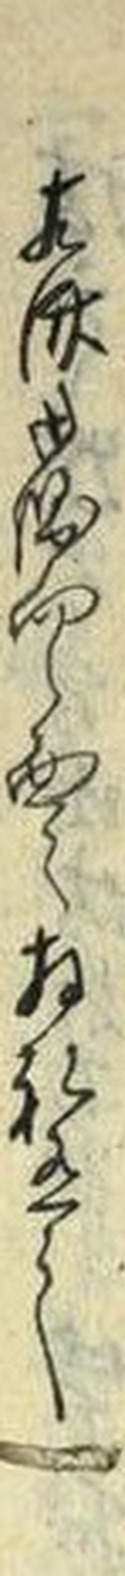相済御側向之面々拝礼有之
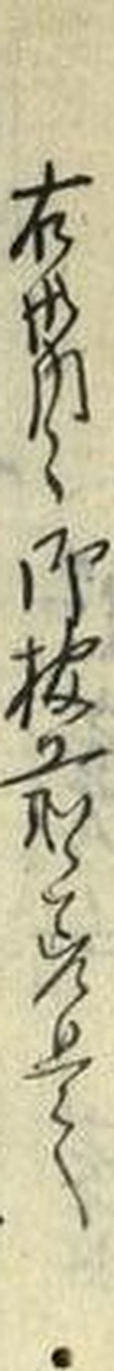右御内々御棺前差上之
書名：少傅日録抄（斉善付側向頭取日記、江戸并道中、初入在国、逝去後…
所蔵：福井県文書館 Fukui Prefectural Archives
